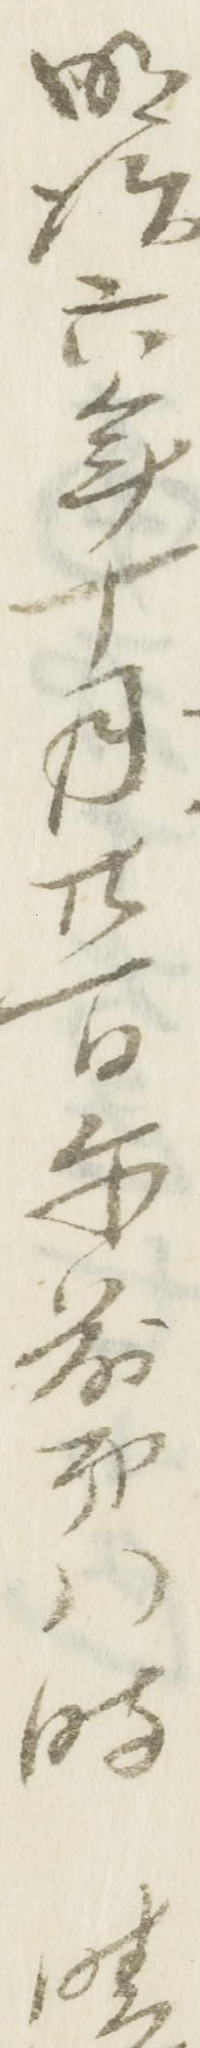明治六年十月廿一日午前第八時晴
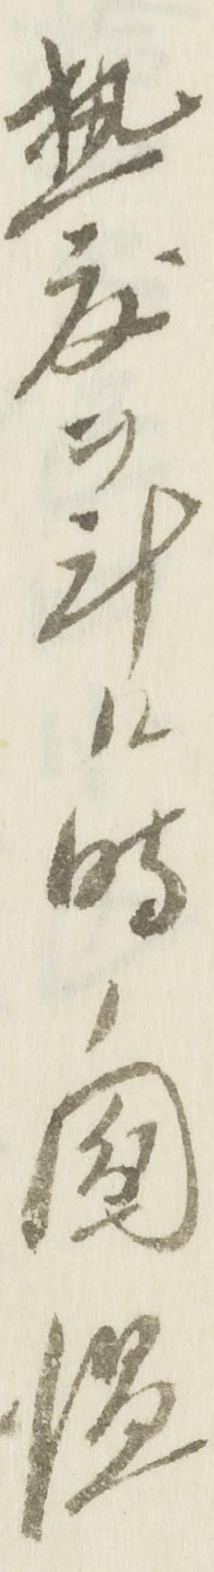熱度ヲ計ル時ノ分温
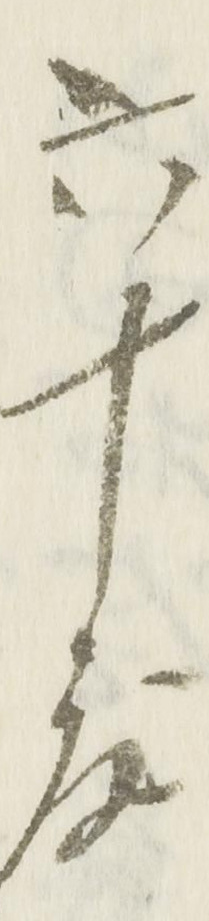六十度
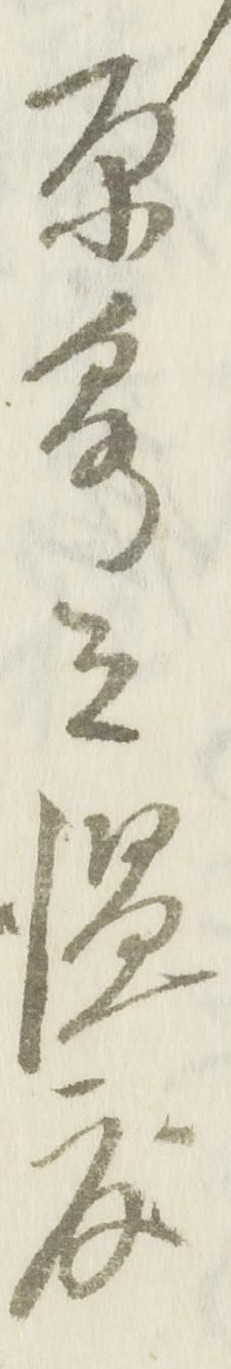原泉之温度
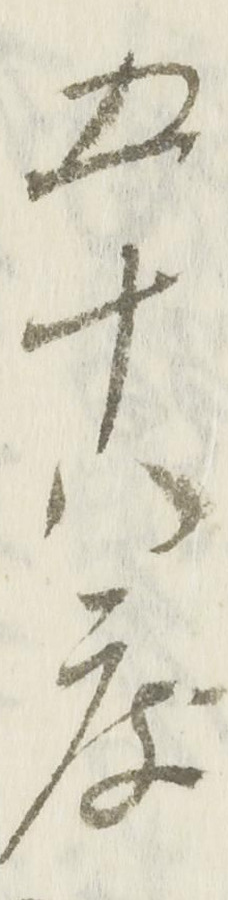五十ハ度
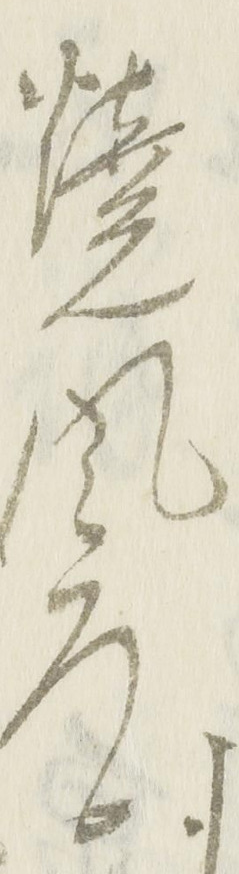焼風呂
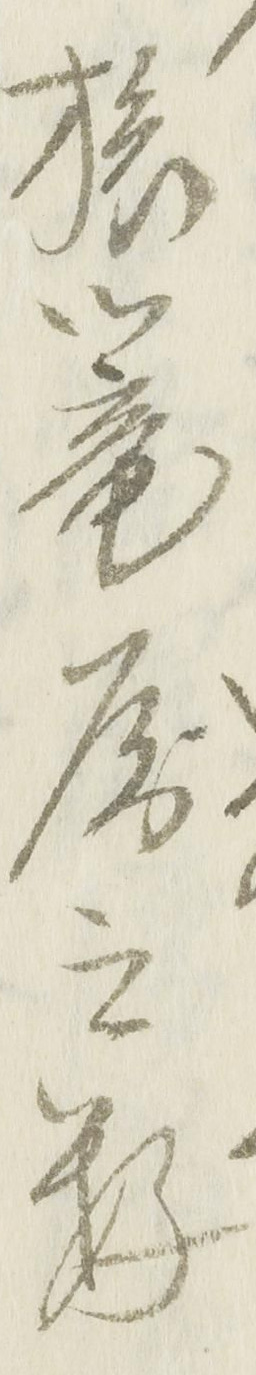旅籠屋之数
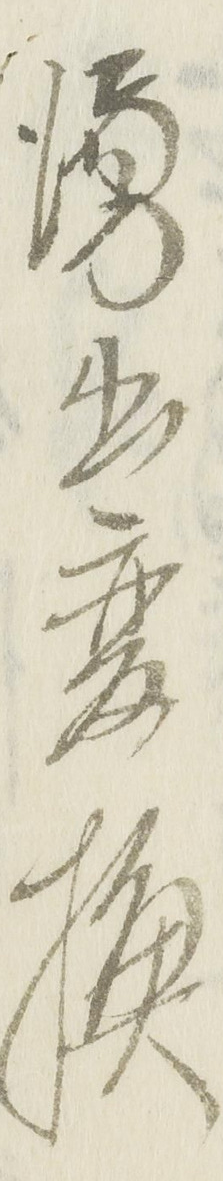湧出変換

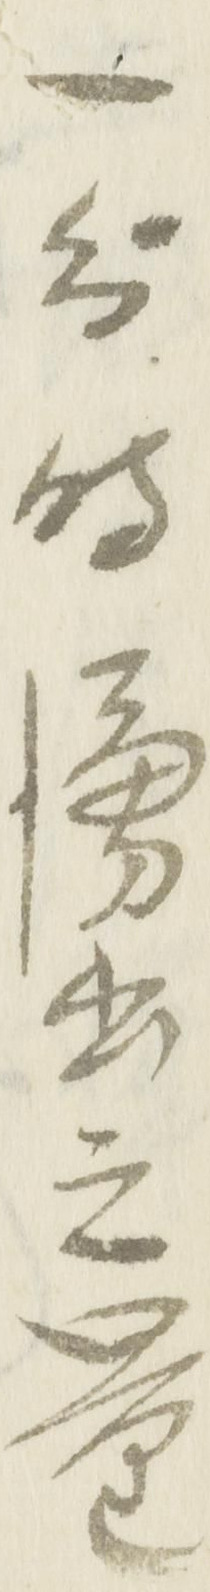一分時湧出之量
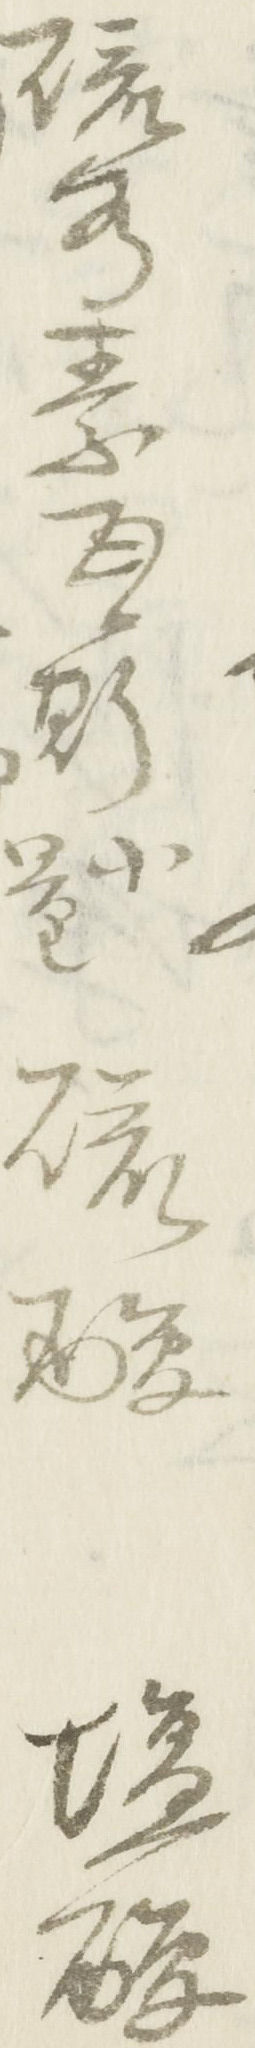硫水素瓦斯少量硫酸塩酸
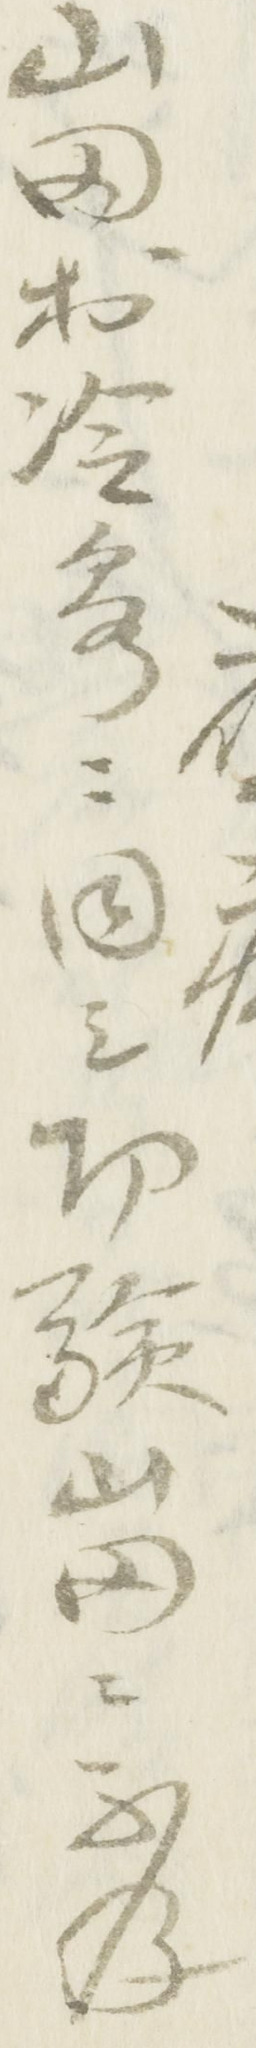山田於冷泉ニ同シ功験山田ニ不及
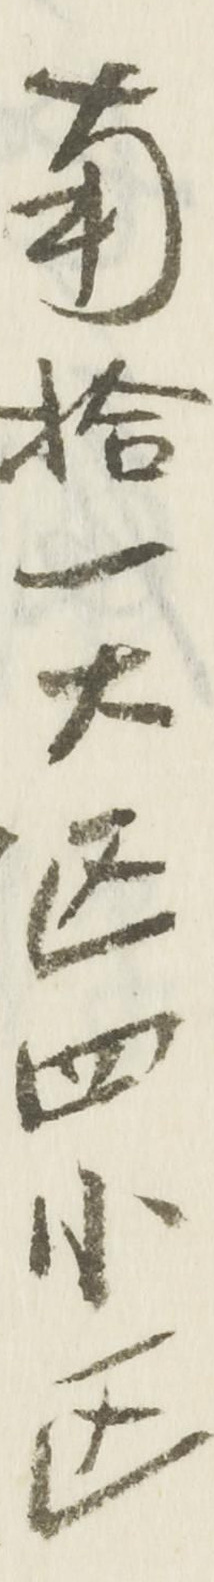南拾一大区四小区
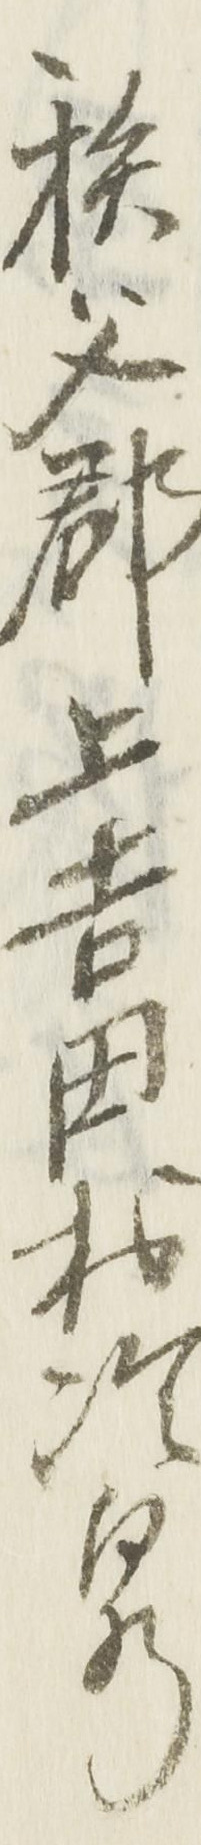秩父郡上吉田村冷泉
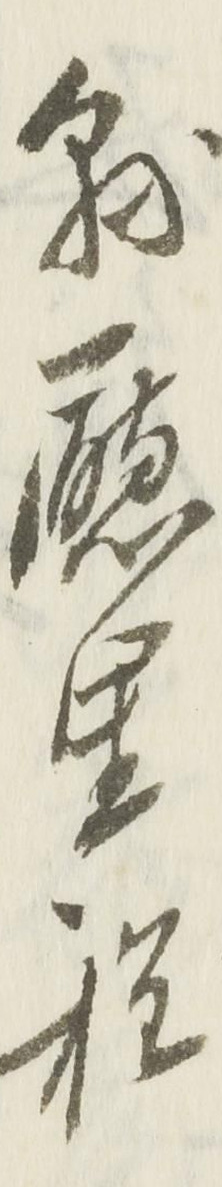県庁里程
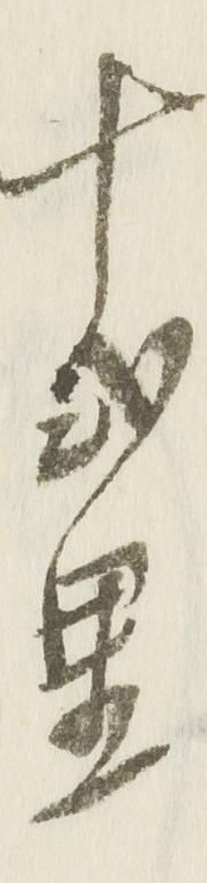十二里
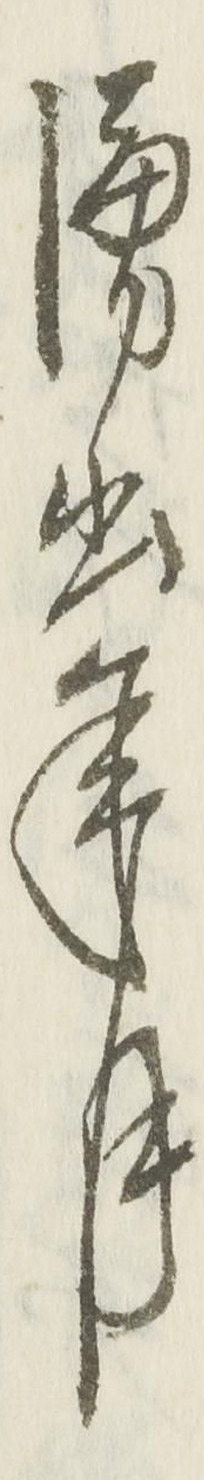湧出年月
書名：温冷泉試験表
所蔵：東京大学地震研究所図書室 Earthquake Research Institute Library, The University of Tokyo, JAPAN
